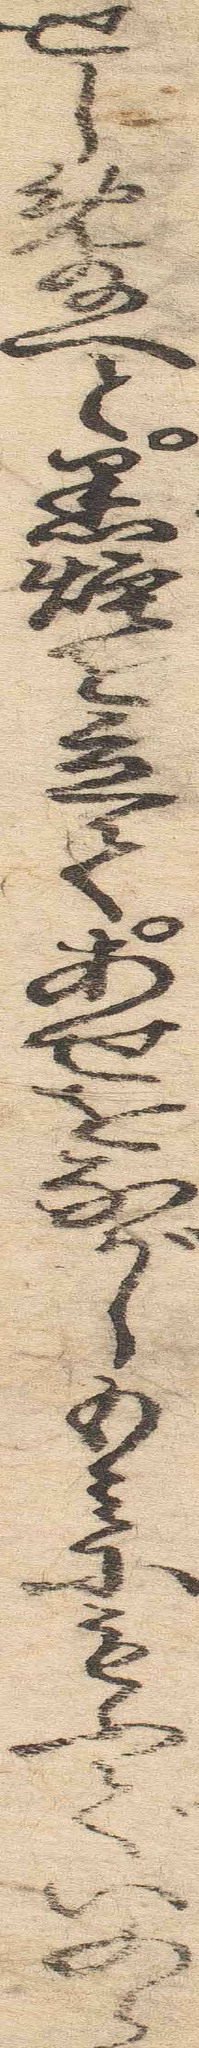せしめた給へと。黒煙を立て。あせをながしもみにもふでいのら
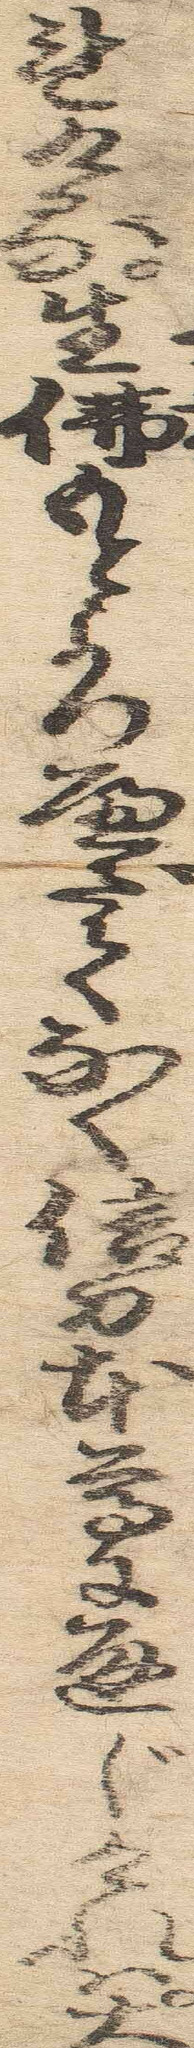れける。生仏もとよりへだてなく信力本尊に通じければ大
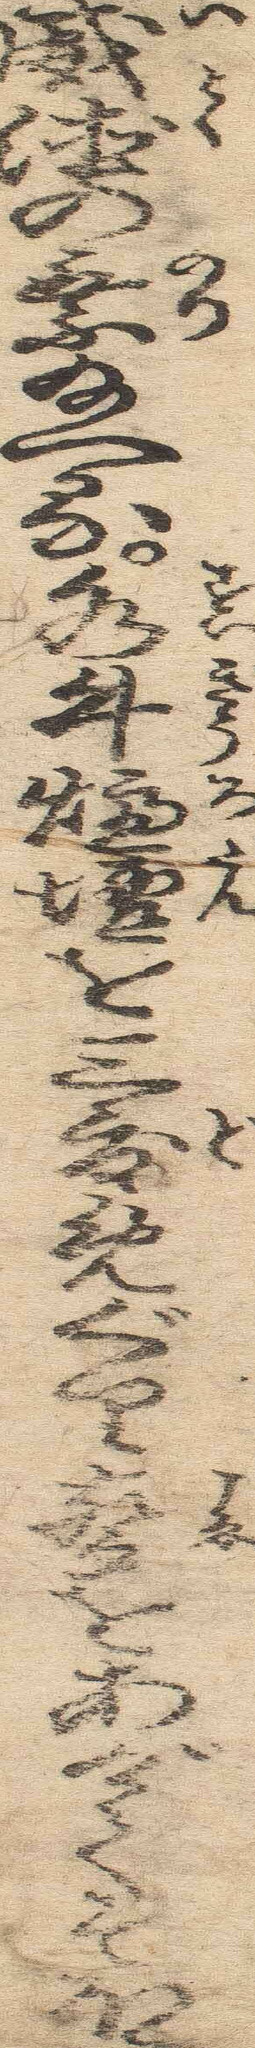威徳の乗給へる。水牛爐壇を三度めぐり声をあげてそ取
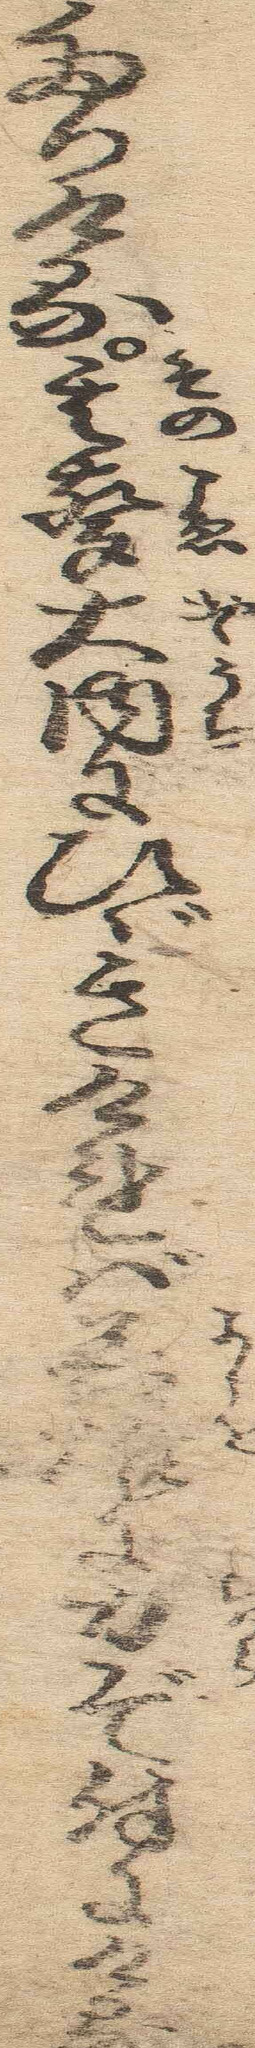たりける。其声大内にひゞきければ善雄に力ぞ付にける。
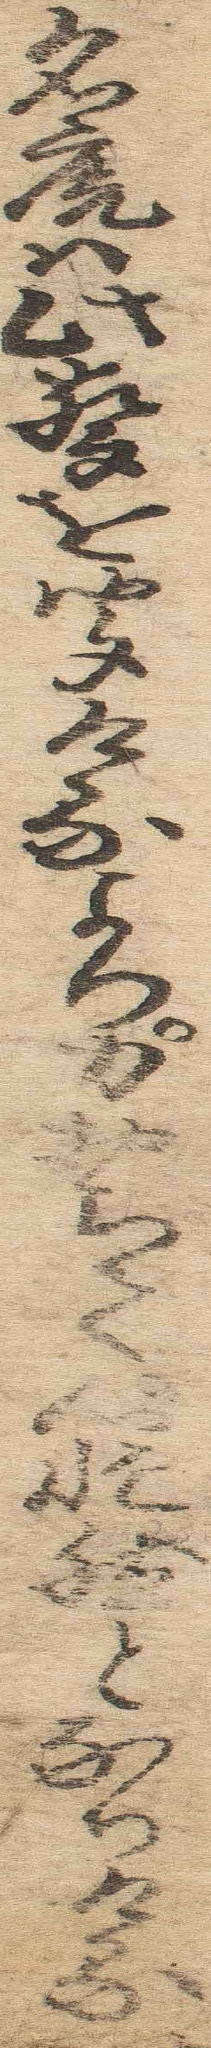名虎は此声を聞けるより。力おちて心茫然となりける時。

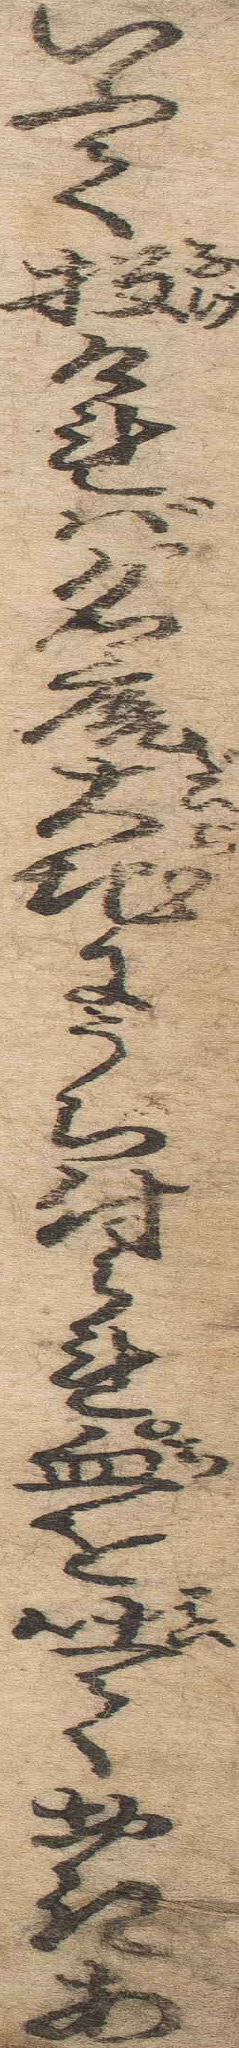いふて投れば。名虎大地にうち付られ。血を吐ておきあ
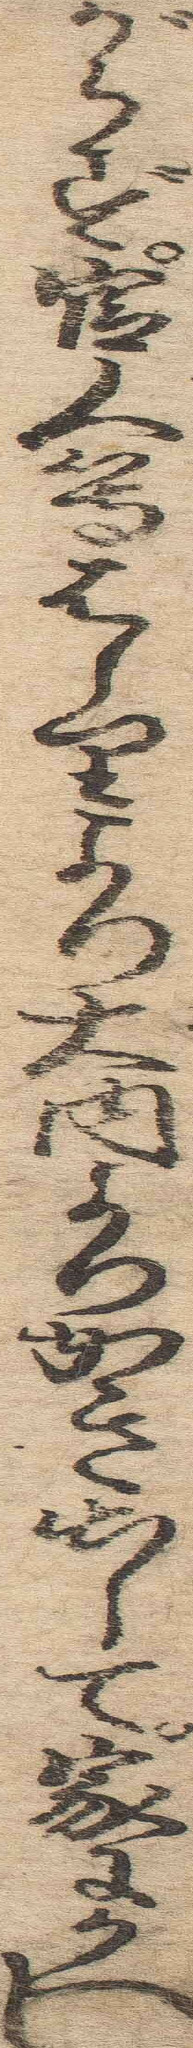がらず。官人等はしりより大内より担き出して。家にかへし
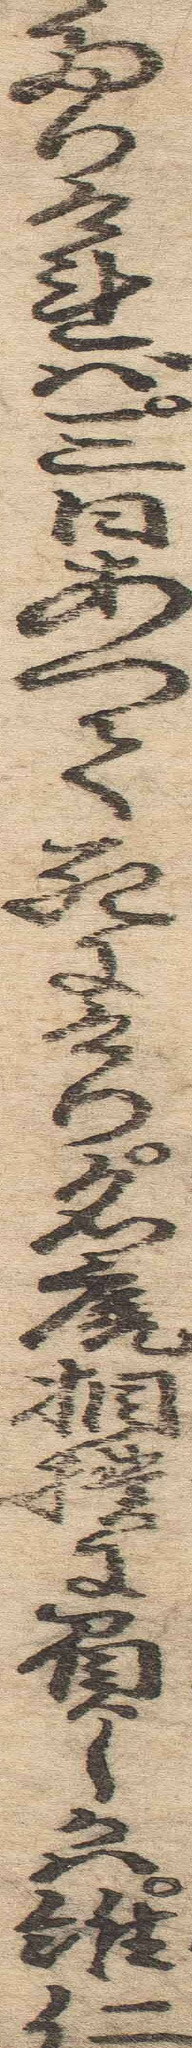たりければ。三日あつて死にけり。名虎相撲に負しかは。惟仁
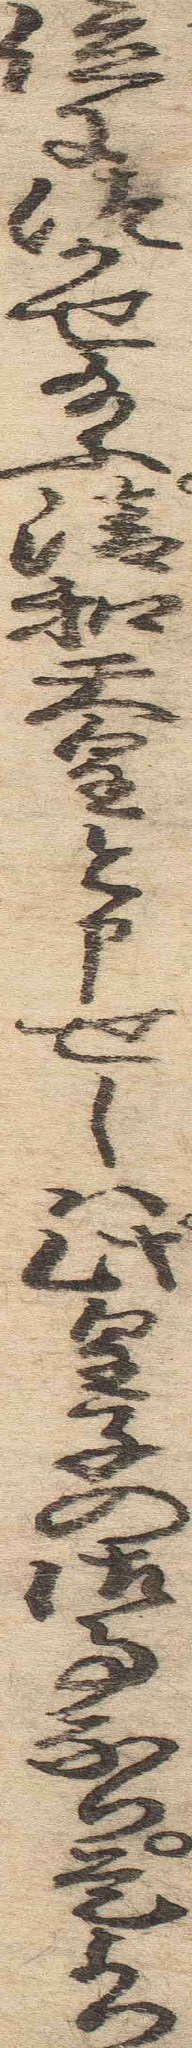位につかせ給ふ。清和天皇と申せしは。此皇子の御事なり。是より
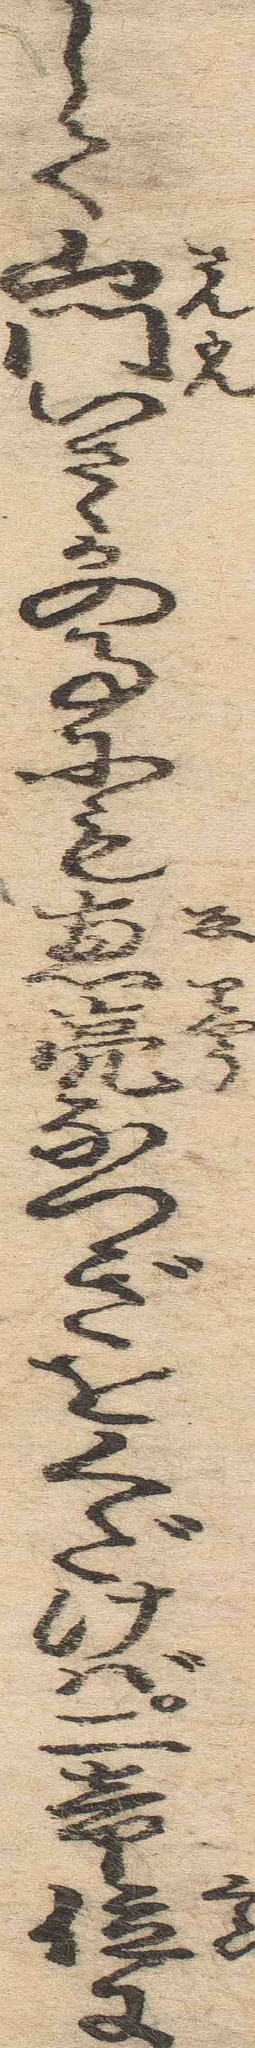して山門いさゝかの事にも恵亮なつぎをくだけば。二帝位に
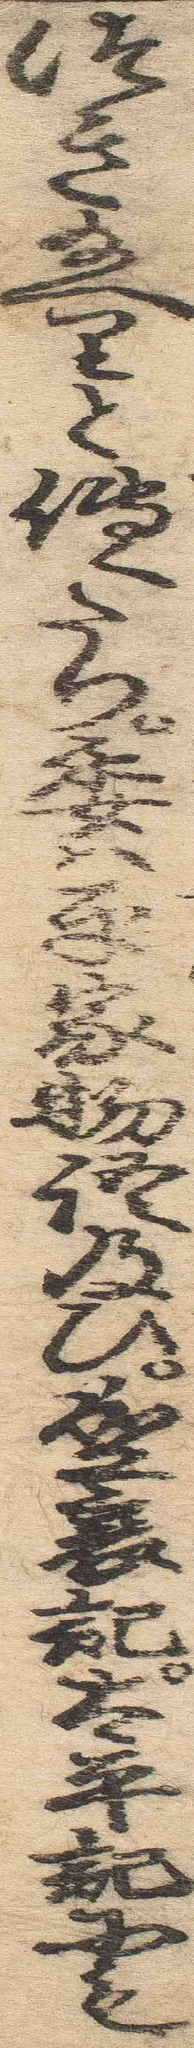つき給へりと伝へたり。委は平家物語及び。盛衰記。太平記にも
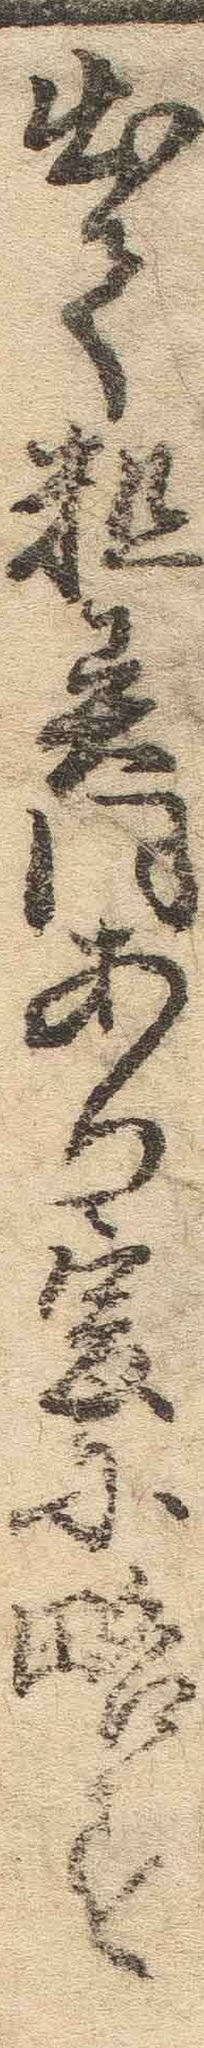出て粗異同あり爰に略す
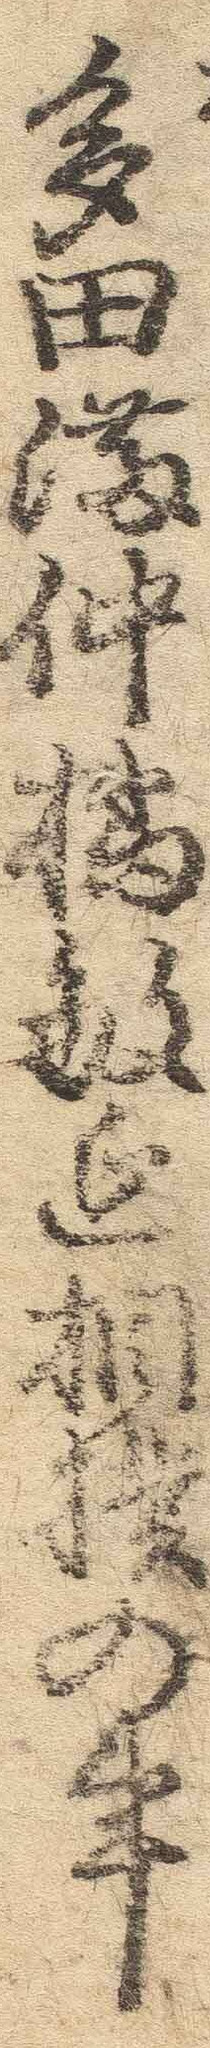多田満仲橘敏延相撲の事
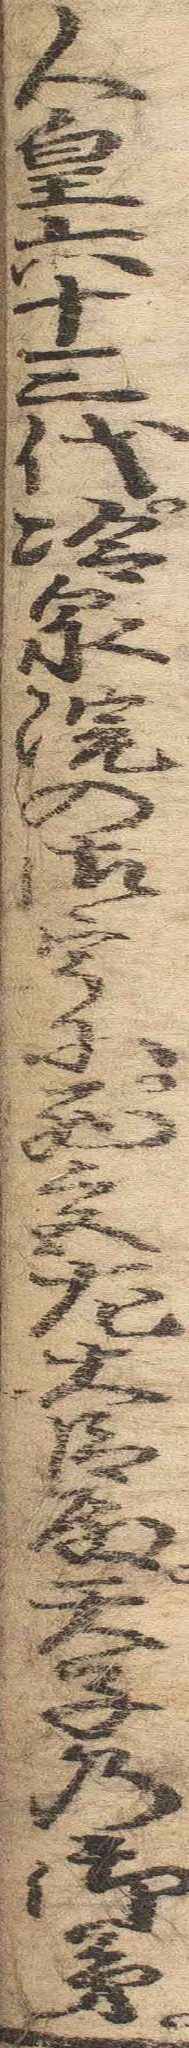人皇六十三代冷泉院の御宇に。西宮左大臣殿。天子の御弟。
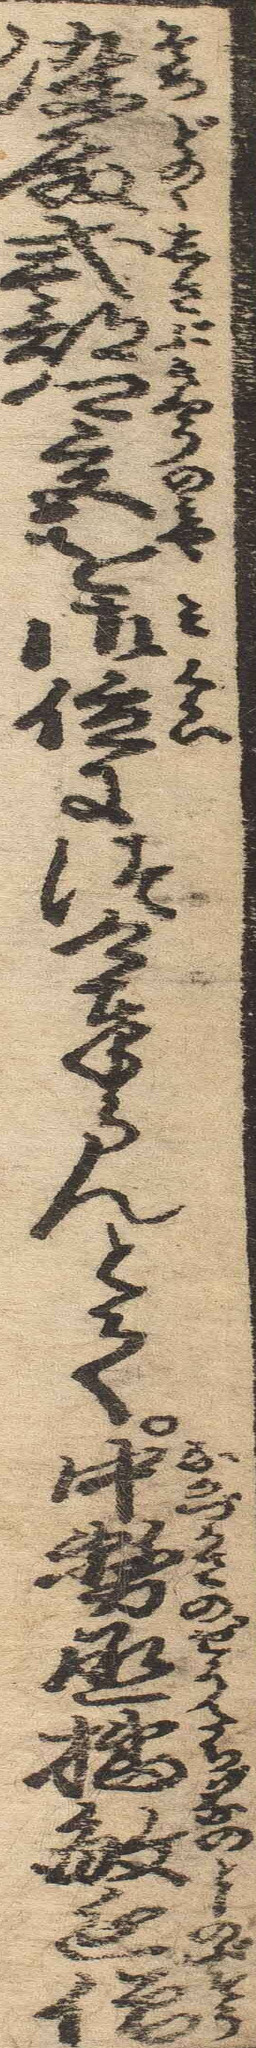染殿式部卿宮を御位につけ奉らんとて中務丞橘敏延僧
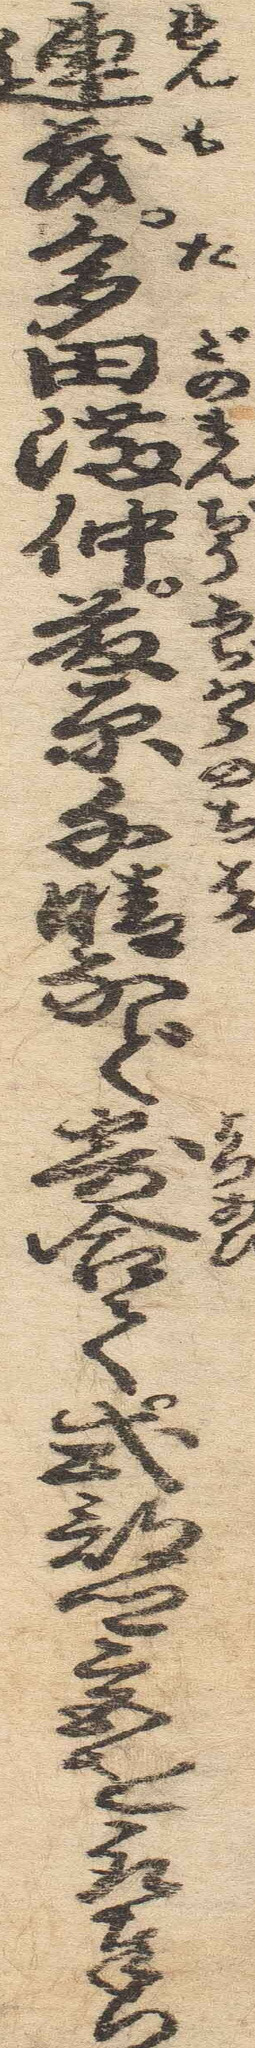連茂。多田満仲。藤原千晴など寄合て。式部卿宮を取奉り
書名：古今相撲大全
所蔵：東京学芸大学附属図書館 国文学研究資料館
